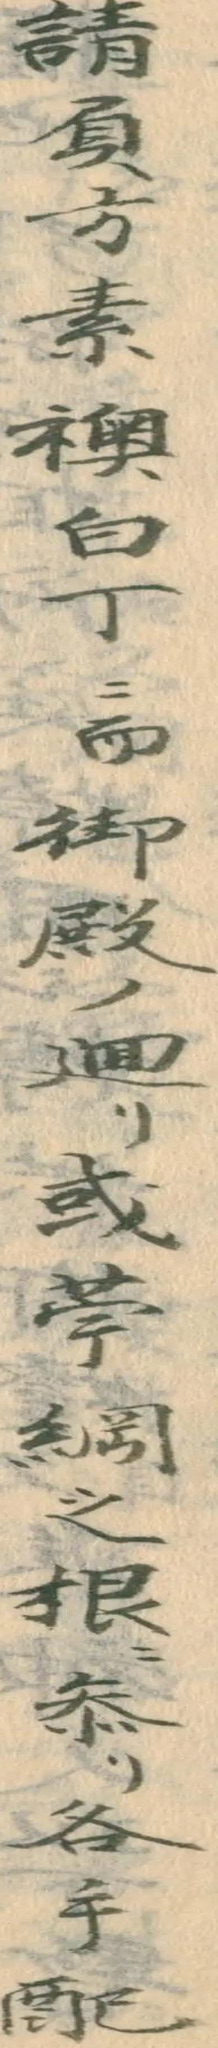請負方素襖白丁ニ而御殿ノ廻リ或苧綱之根ニ参リ各手配
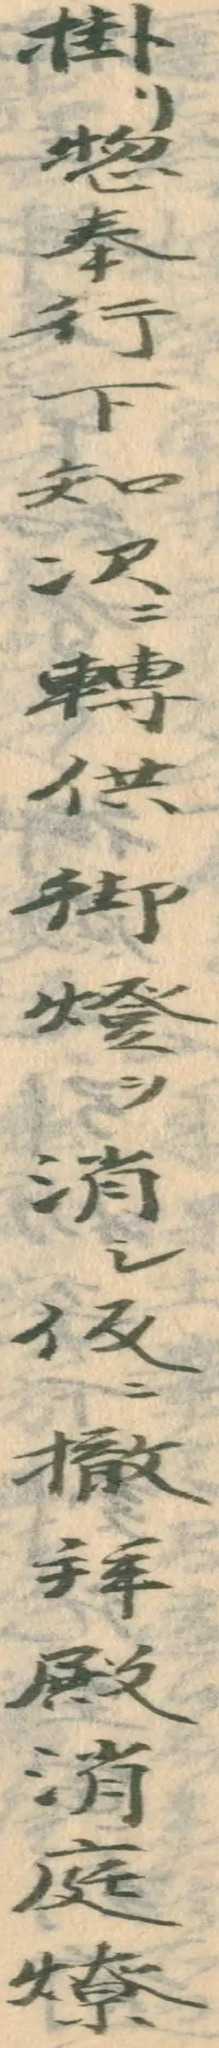掛リ惣奉行下知次ニ転供御燈ヲ消シ仮ニ撤拝殿消庭燎

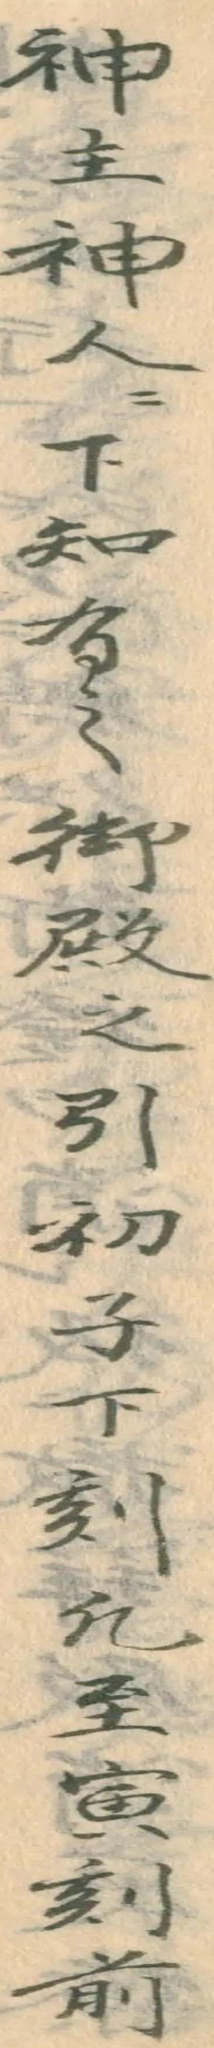神主神人ニ下知有之御殿之引初子下刻凡至寅刻前
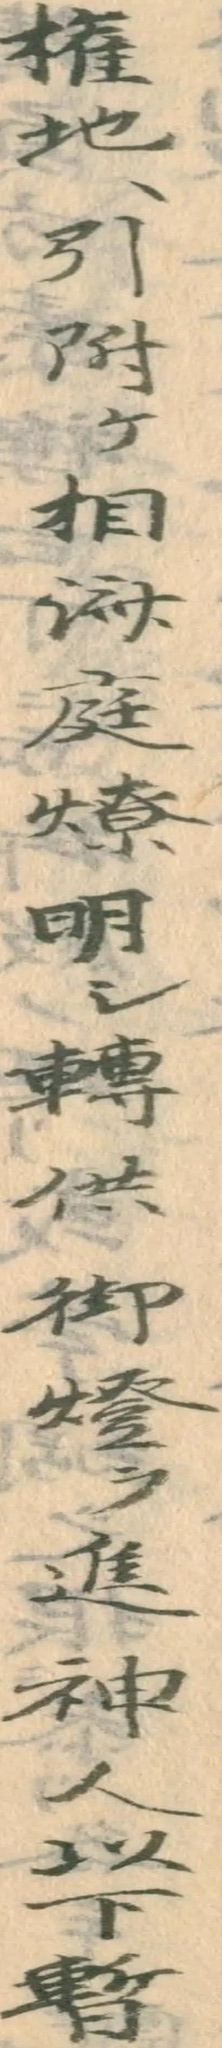権地ヘ引附ケ相済庭燎明シ転供御燈ヲ進神人以下暫
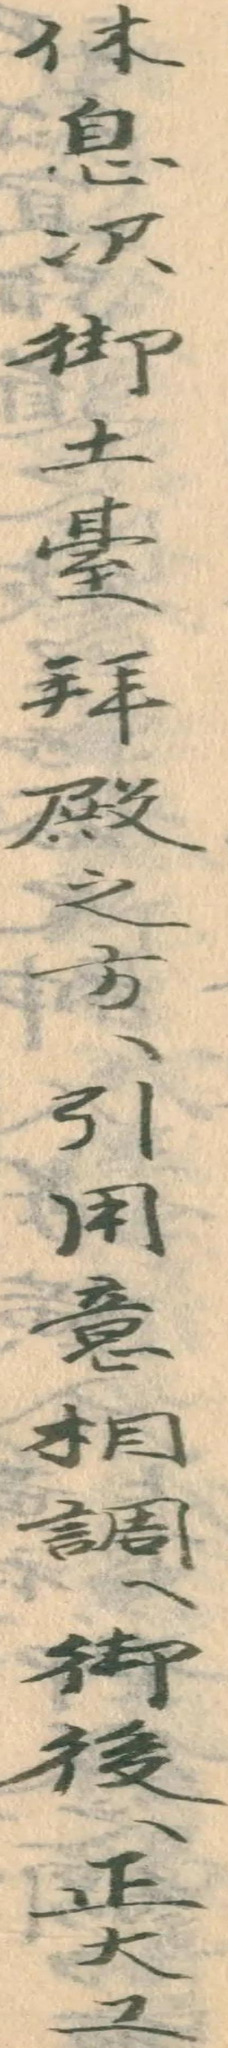休息次御土台拝殿之方ヘ引用意相調ヘ御後へ正大工
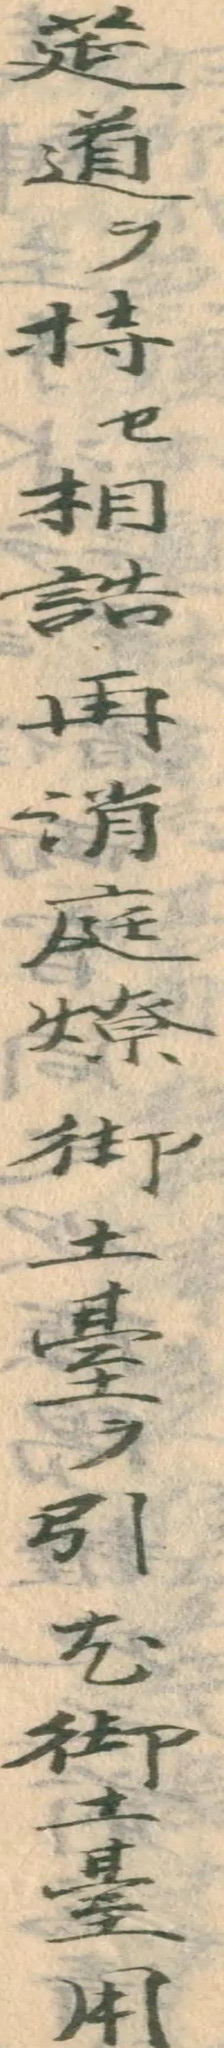筵道ヲ持セ相詰再消庭燎御土台ヲ引尤御土台用
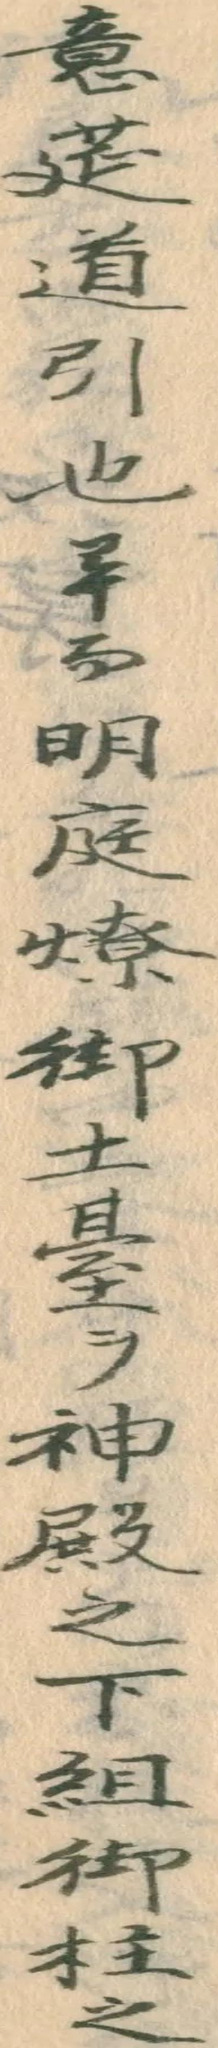意筵道引也畢而明庭燎御土台ヲ神殿之下組御柱之
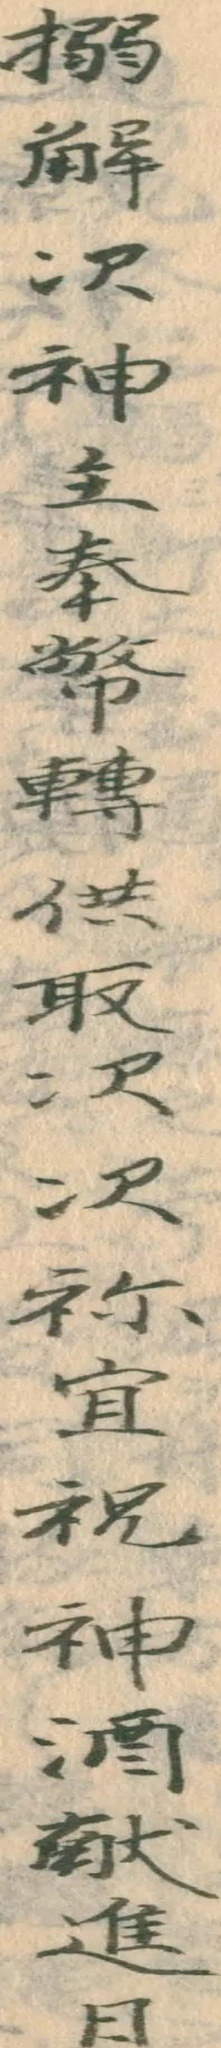搦解次神主奉幣転供取次次祢宜祝神酒献進日
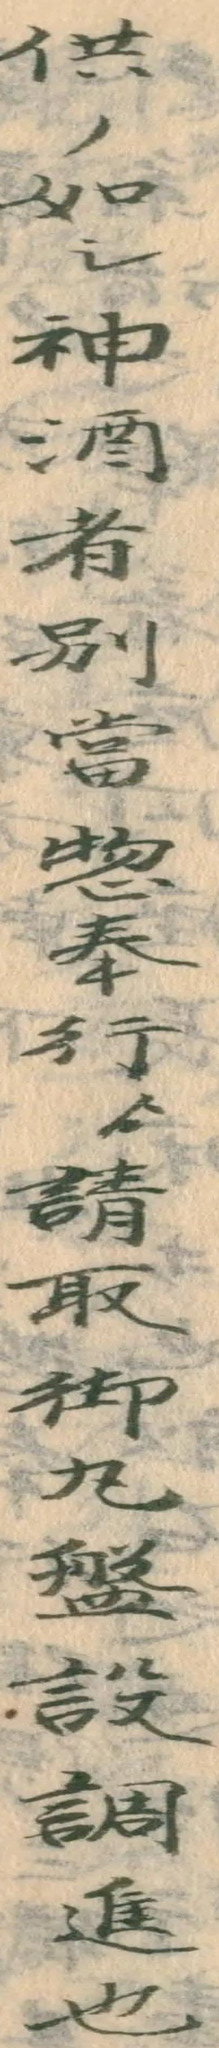供ノ如シ神酒は別当惣奉行ゟ請取御丸盤設調進也
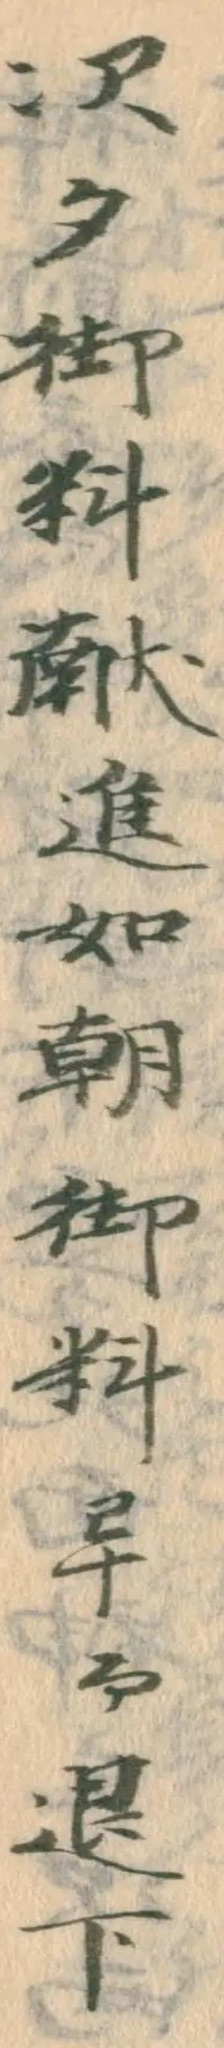次夕御料献進如朝御料畢而退下
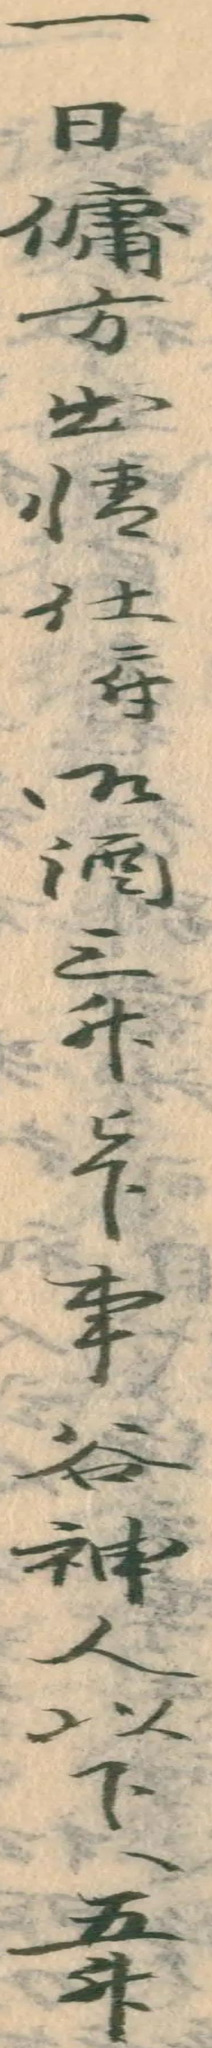一日傭方出情仕ニ付御酒三升被下事谷神人以下へ五升
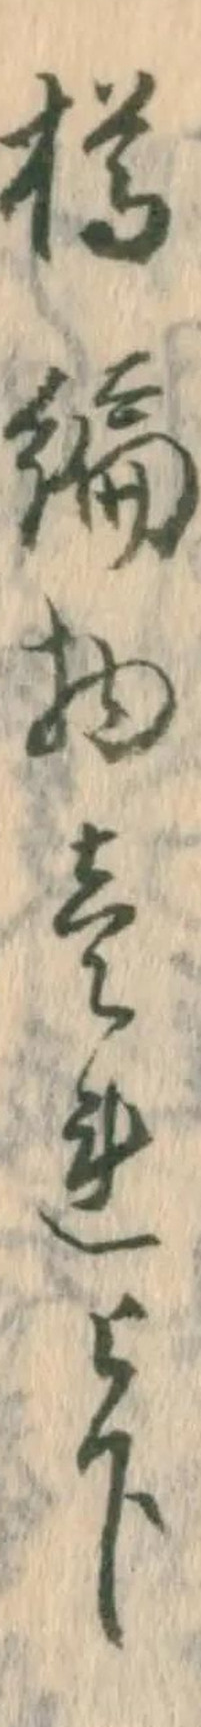樽編物壱連被下
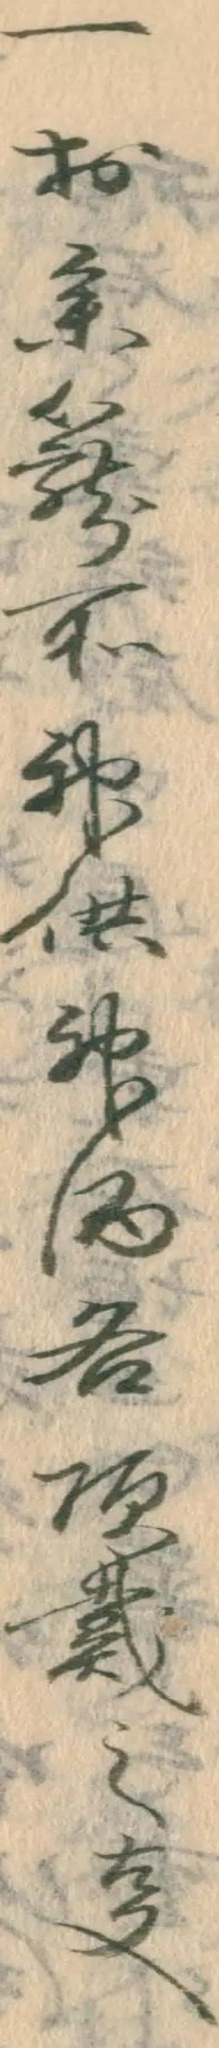一於参籠所神供神酒各頂戴之事
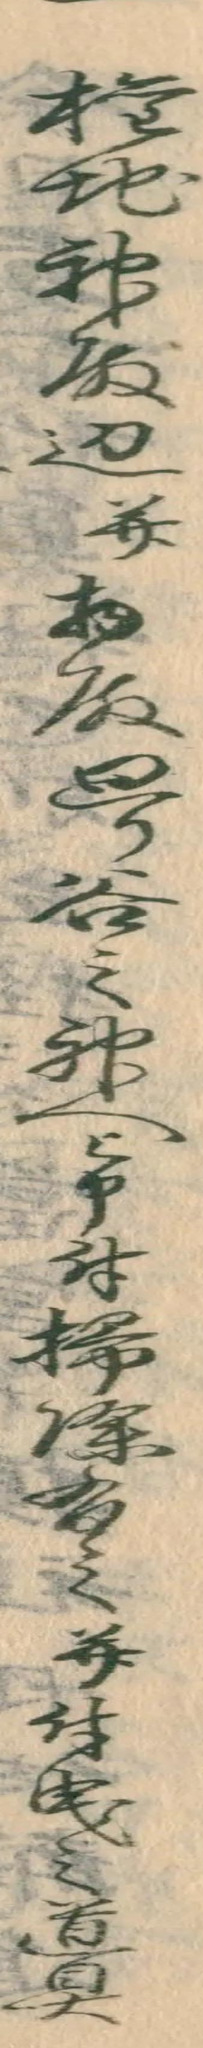一権地神殿辺并拝殿廻り谷之神人被申付掃除有之并付曳之道具
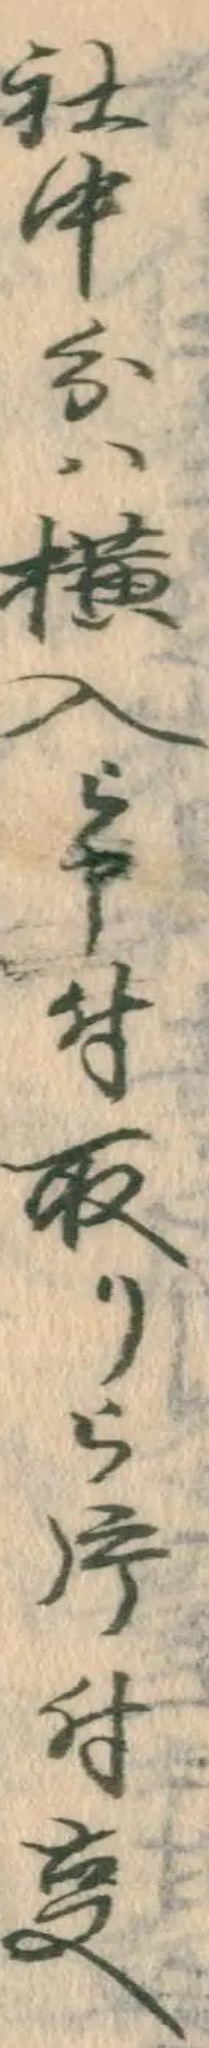社中分ハ横入被申付取り被片付事
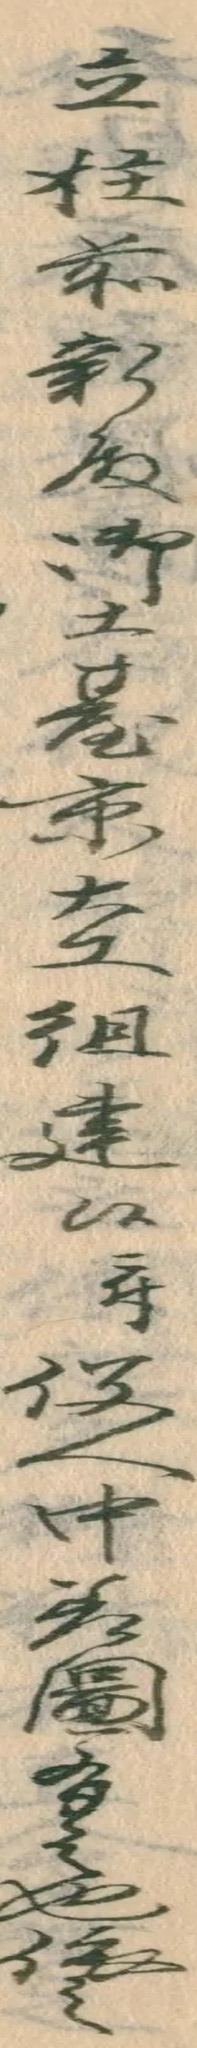一立柱前新殿御土台京大工組建候ニ付役人中差図有之也依之
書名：賀茂社記録. 第17冊
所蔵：国立国会図書館 National Diet Library, JAPAN
